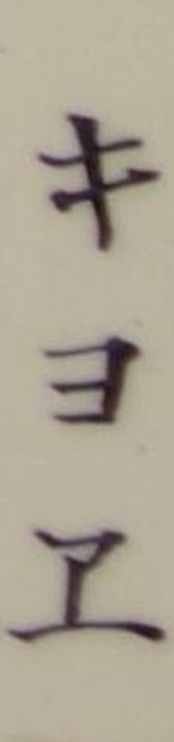キヨヱ
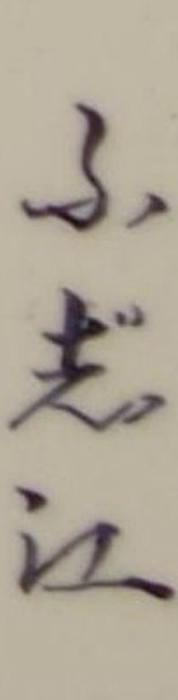ふじ江
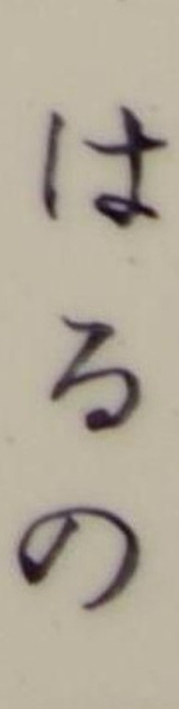はるの
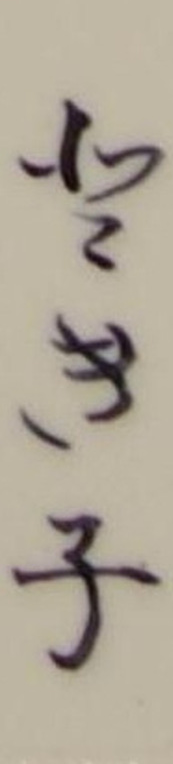とき子
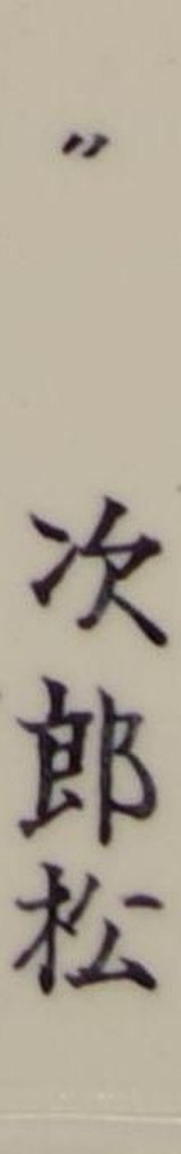次郎松
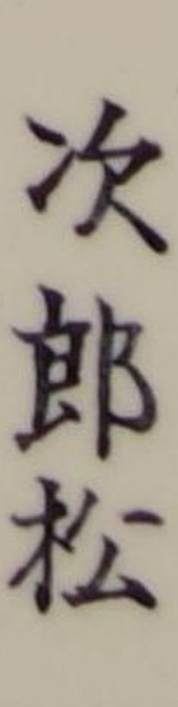次郎松
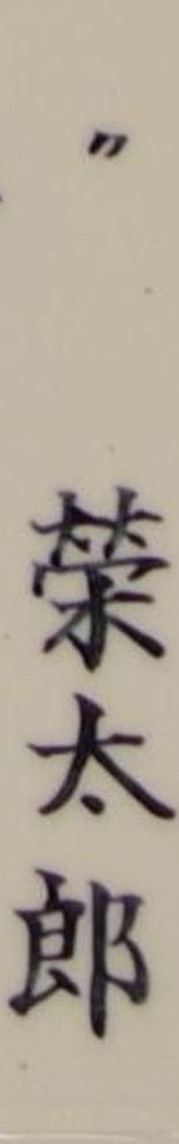榮太郎
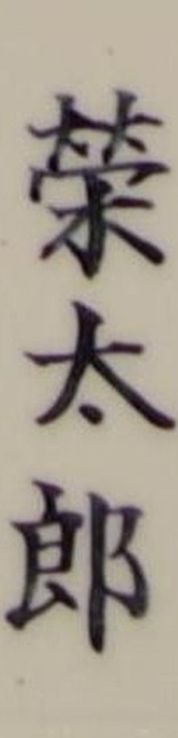榮太郎
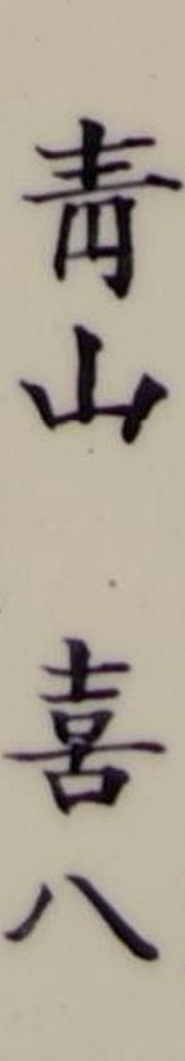青山喜八
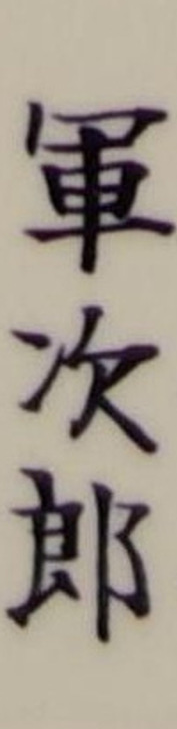軍次郎
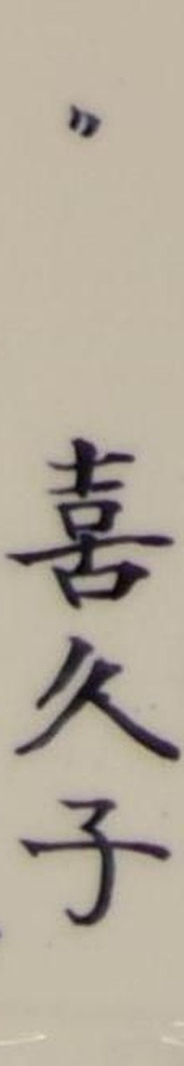喜久子
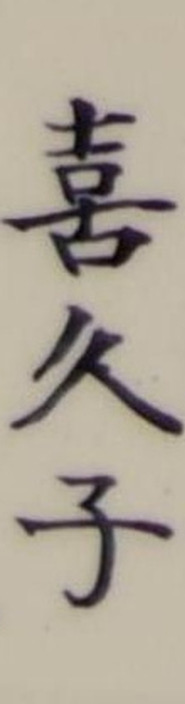喜久子
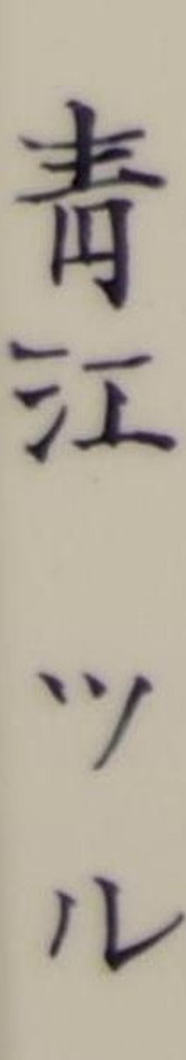青江ツル

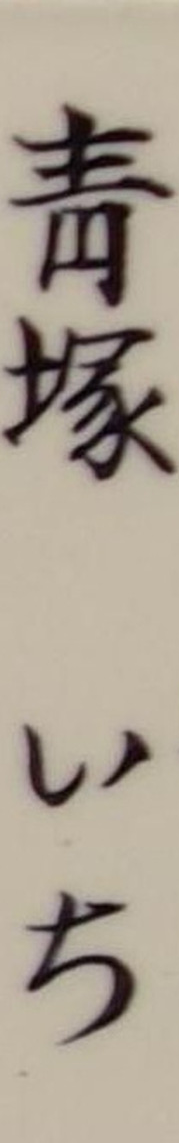青塚いち
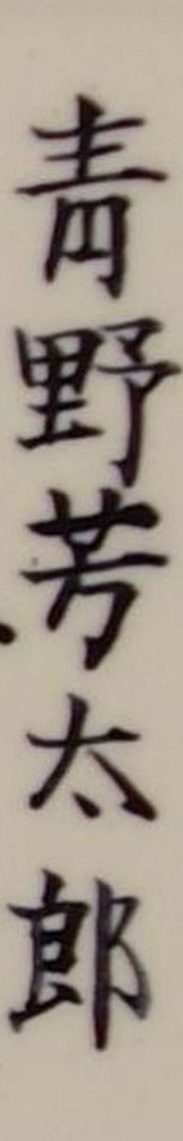青野芳太郎
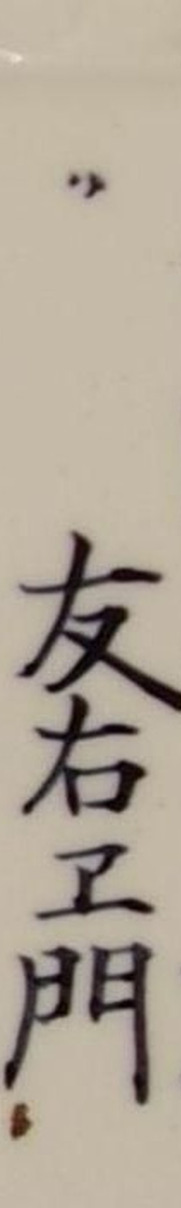友右ヱ門
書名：E~L
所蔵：高野山金剛峯寺
